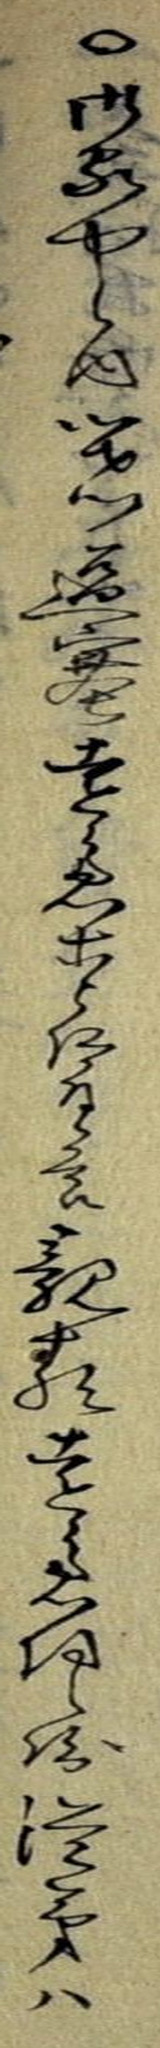○御家中之内閉門逼塞遠慮等被仰付候節親類遠慮伺之儀従弟は
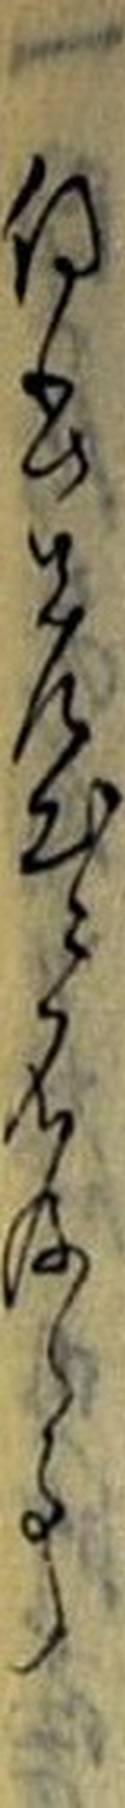伺書差出に不及候事
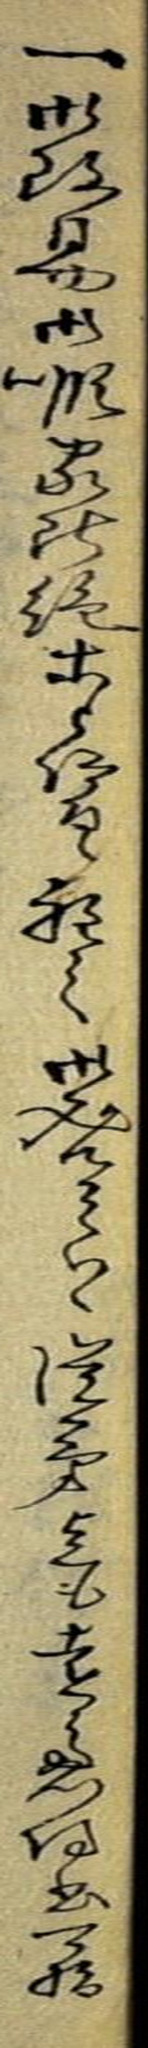一御改易御暇家断絶等被仰付候程之御咎に候はヽ従弟迄も遠慮伺書可指
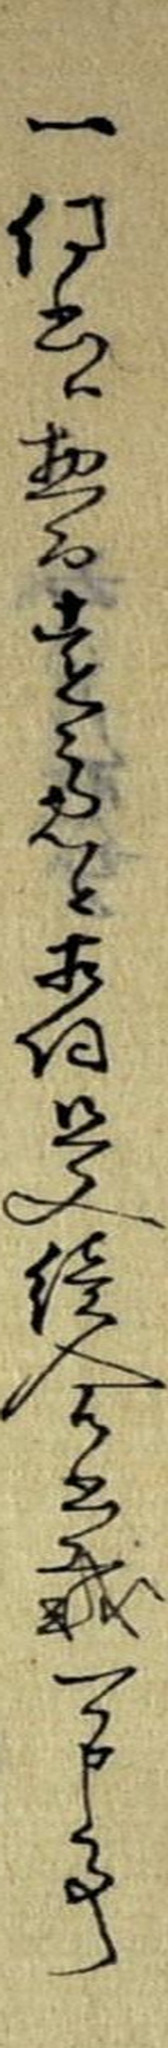一伺書は惣而遠慮と相伺且又続合書載可申事
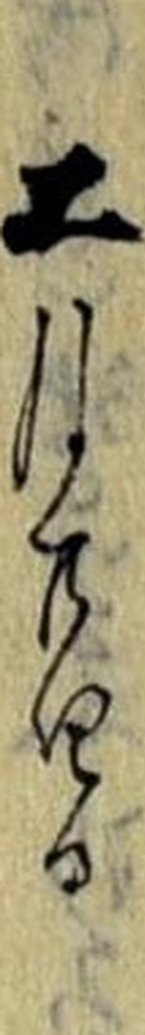二月廿四日
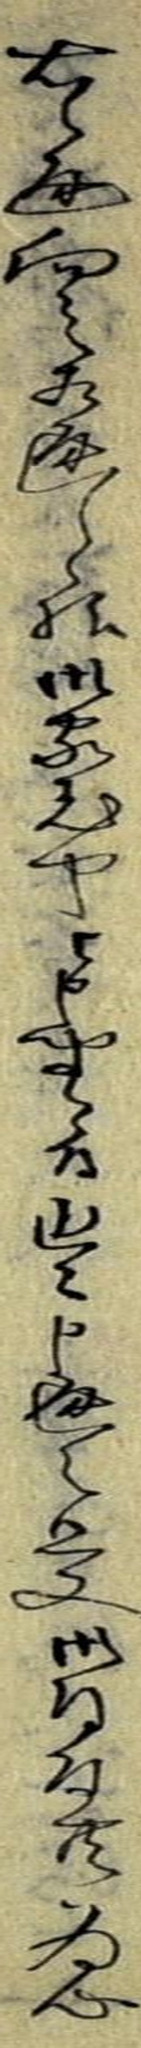右之通向々へ相通し候様御家老中被申聞候に付追々申通し且又御目付共へ為心
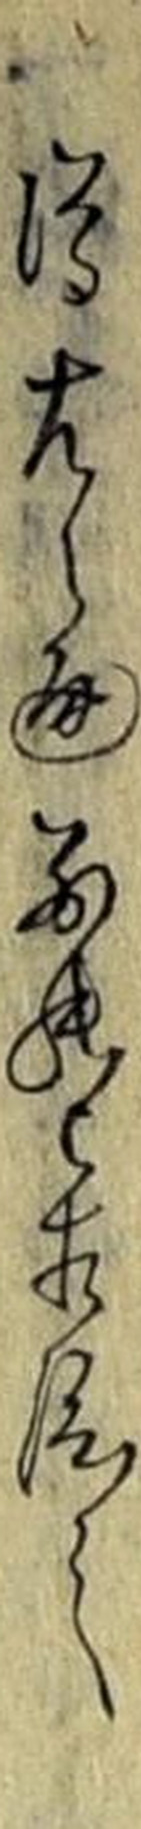得左之通別紙被相渡之
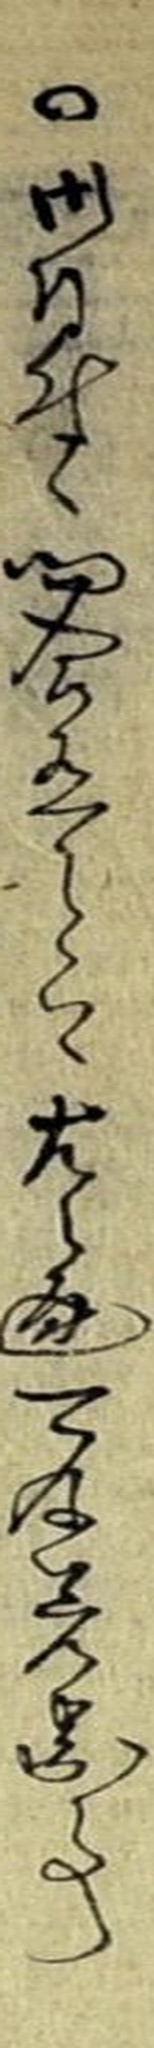○御目付へ問合有之候はヽ左之通可及差図事
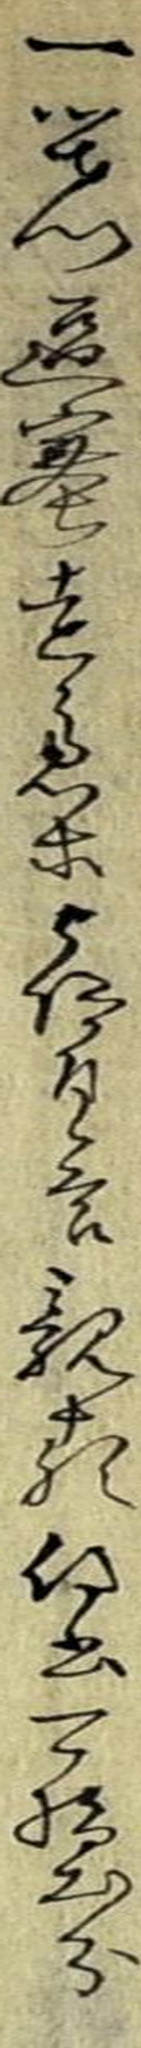一閉門逼塞遠慮等被仰付候節は親類伺書可指出分
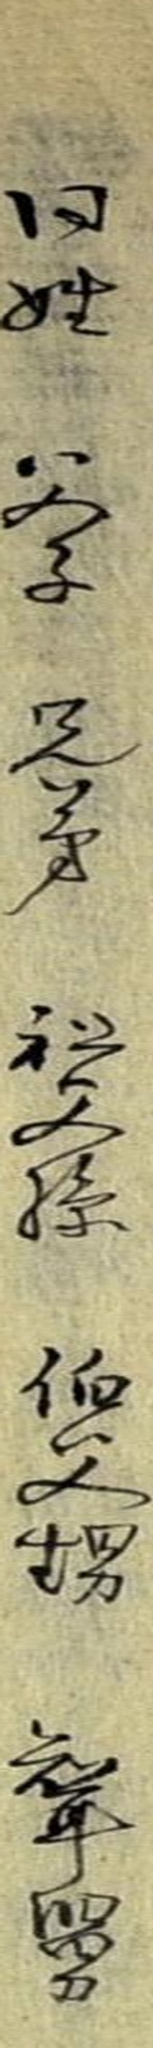同姓父子兄弟祖父孫伯父甥聟舅
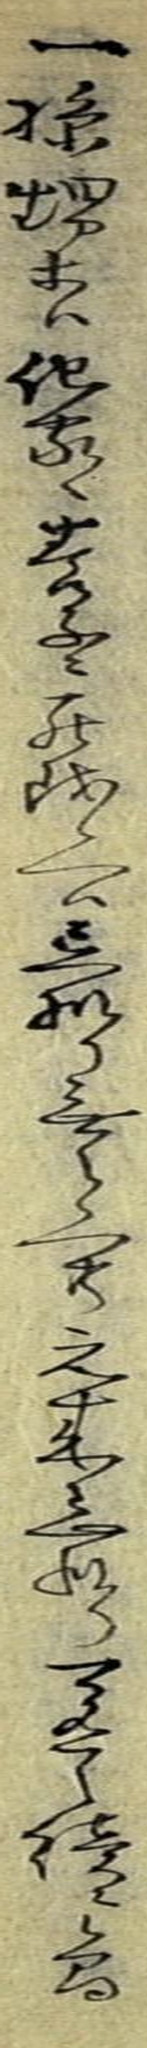一孫甥等は他家へ養子に罷越候へは忌掛り無之候へ共元来忌掛り可有之続に候間
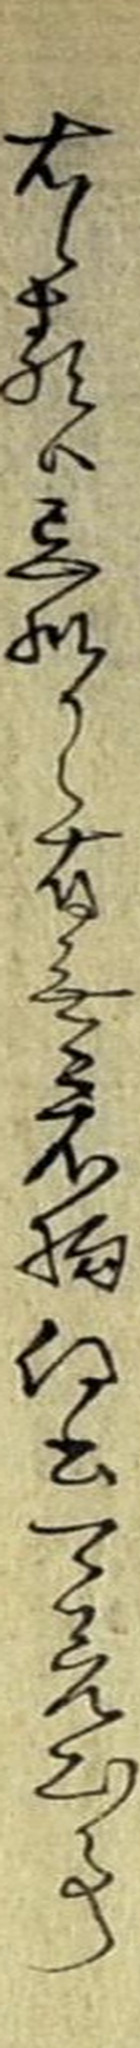右之類は忌掛り之有無に不拘伺書可差出事
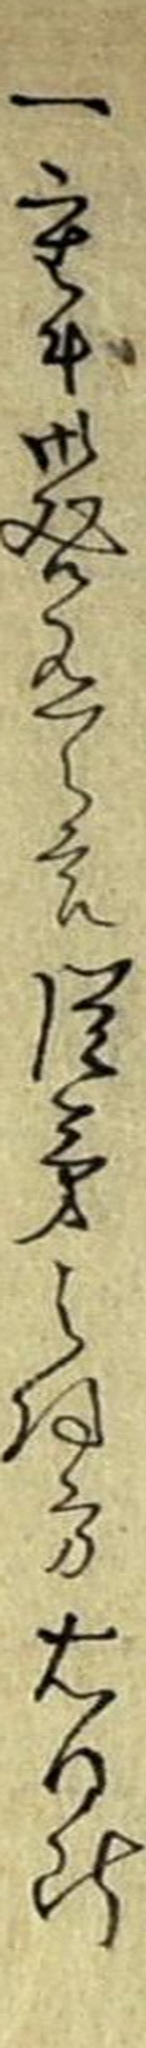一重キ御咎有之節従弟之伺方右同断
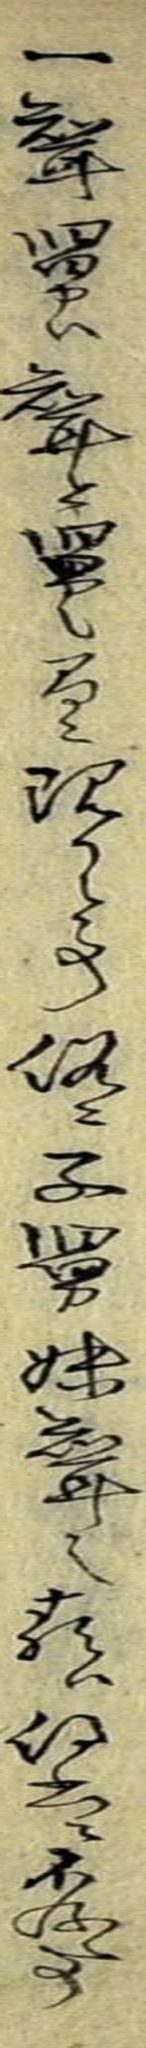一聟舅は聟と舅之間に限り候事仮に子舅妹聟之類は伺書に不及候事
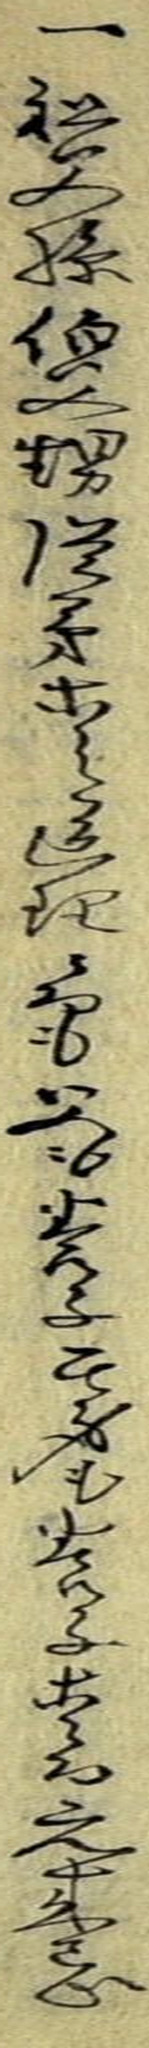一祖父孫伯父甥従弟等之道理に而も父も養子其身も養子等に而元来忌
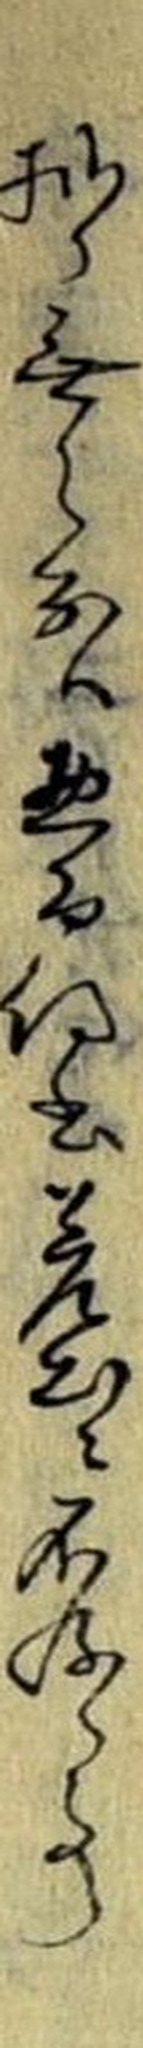掛り無之分は惣而伺書差出に不及候事
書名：命令之部 四
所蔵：福井県文書館 Fukui Prefectural Archives
